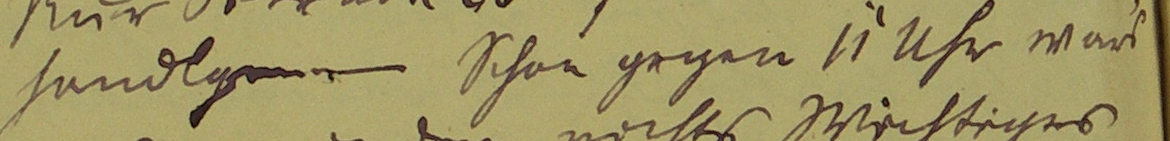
handlungen- Schon gegen 11 Uhr war
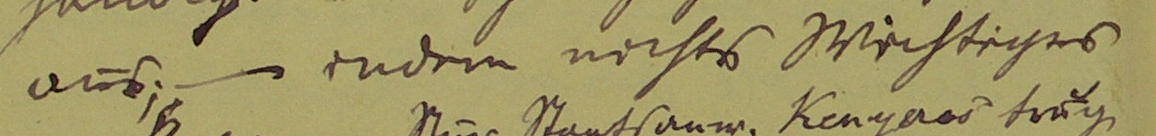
aus- indem nichts Wichtiges
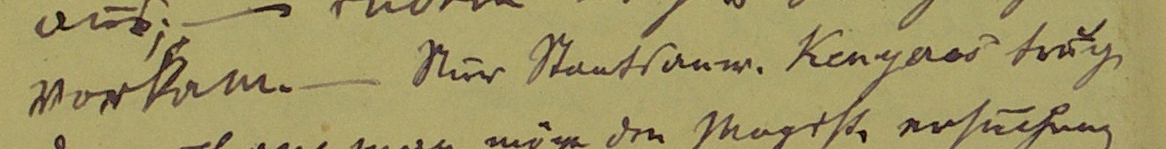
vorkam..—Nur Staatsanwalt Kenyeres trug
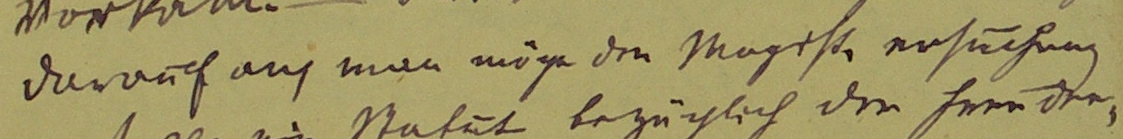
darauf an man möge den Magistrat ersuchen
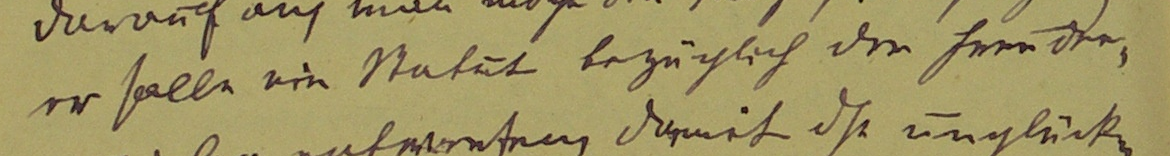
er solle ein Statut bezüglich der Fremden¬
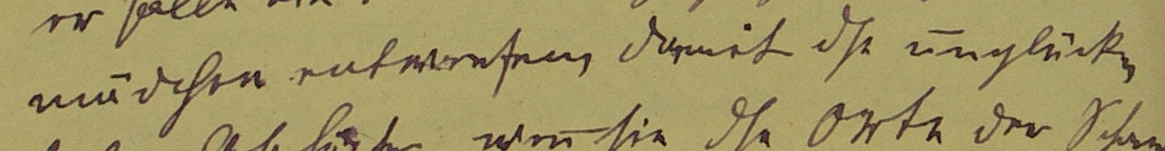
mädchen entwerfen, damit diese unglück¬
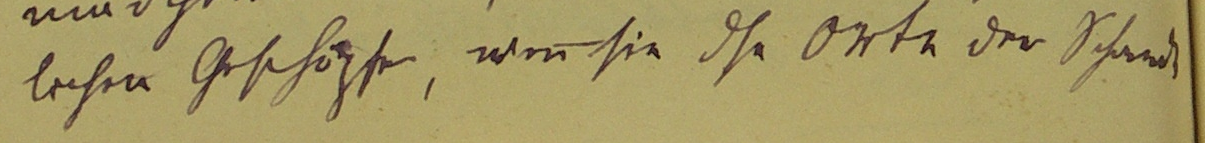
lichen Geschöpfe, wenn sie diese Orte der Schande
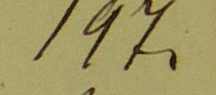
197
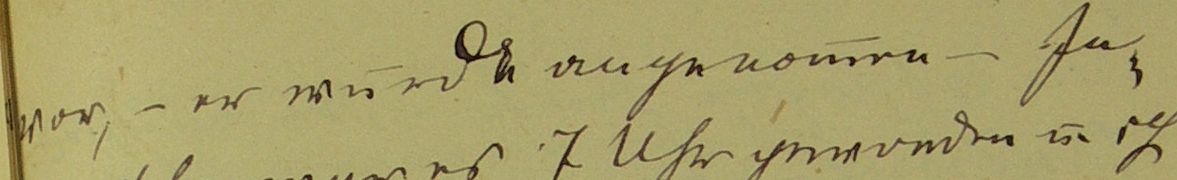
vor,- er wurde angenommen.- In¬
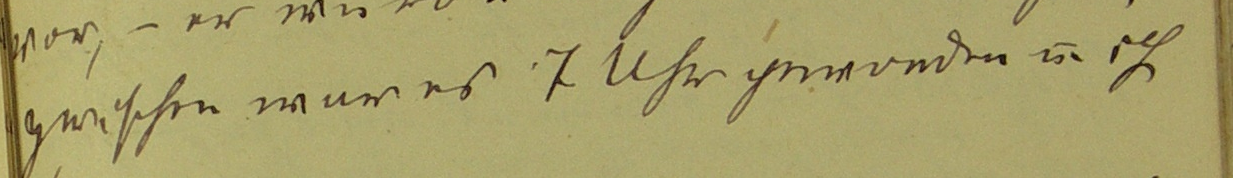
zwischen war es 7 Uhr geworden und ich
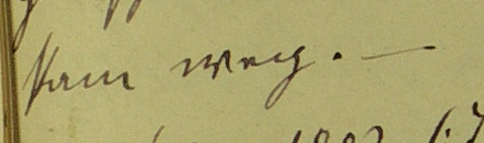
kam weg.
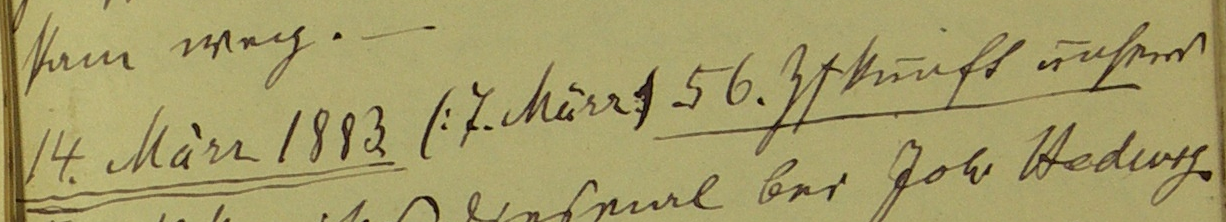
14. März 1883 ( : 7. März: ) 56. Zusammenkunft unseres
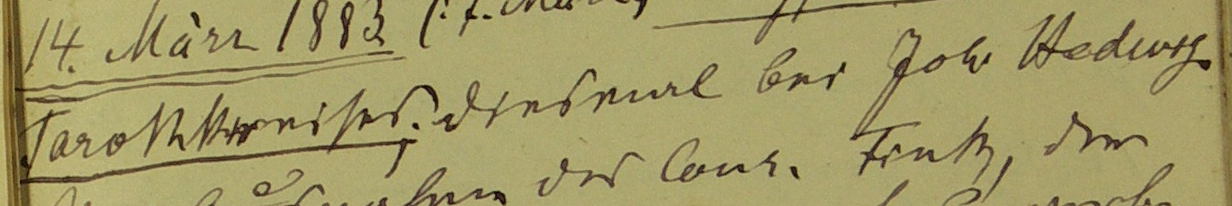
Tarokkreises. Diesmal bei Joh. Hedwig.
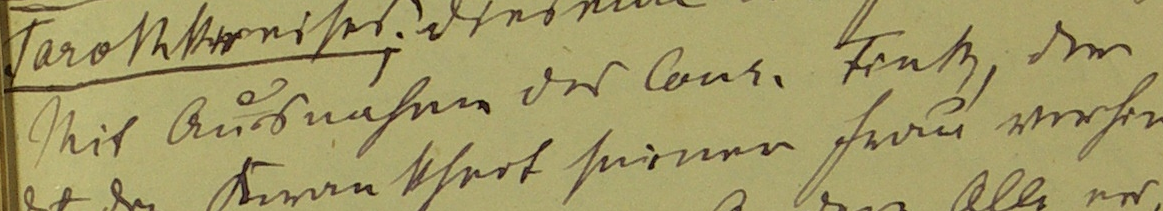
Mit Ausnahme des Conr. Fink, der
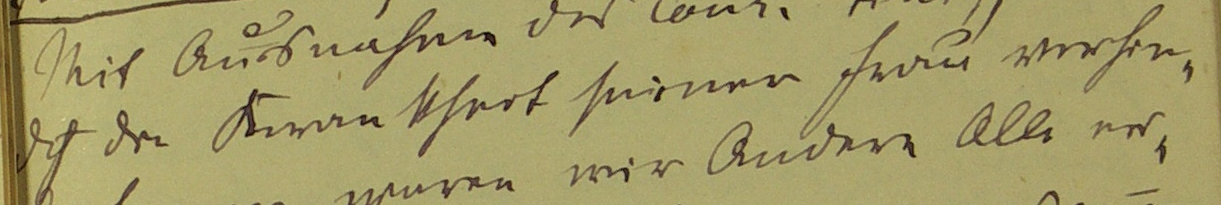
durch die Krankheit seiner Frau verhin¬
